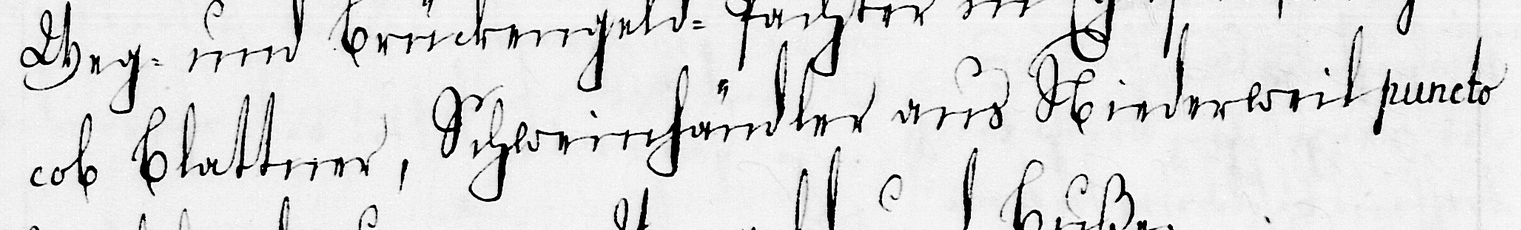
cob Blattner, Schweinhändler aus Niederweil puncto
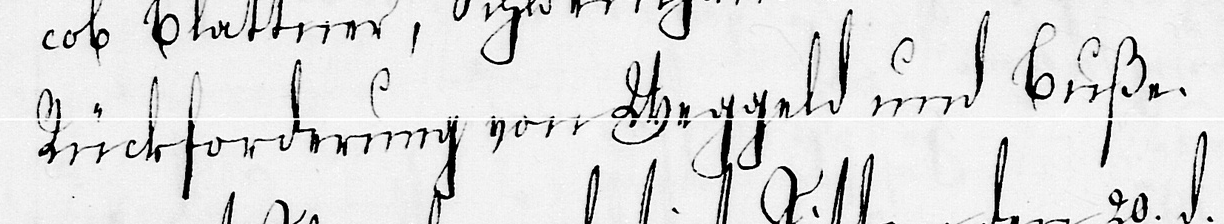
Rückforderung von Weggeld und Buße.
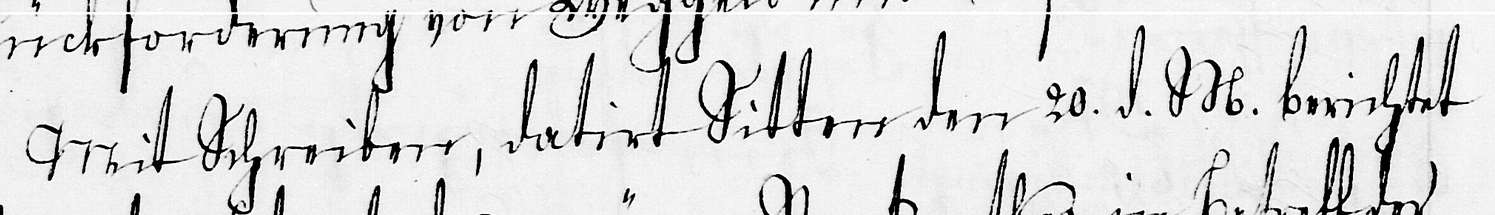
Mit Schreiben, datirt Sitten den 20. d. M. berichtet
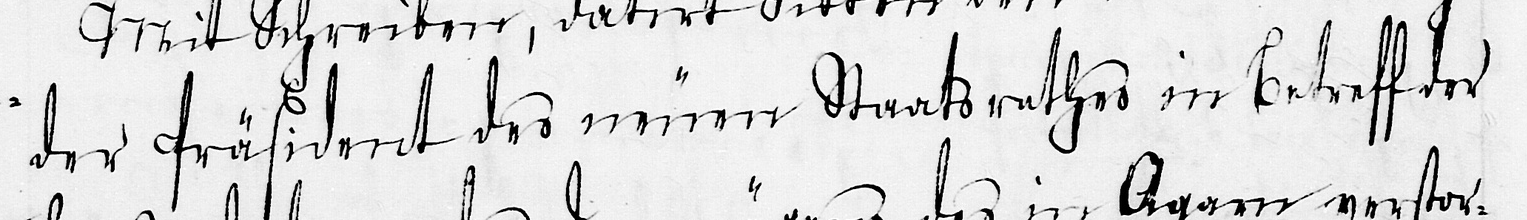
der Präsident des neuen Staatsrathes in Betreff der
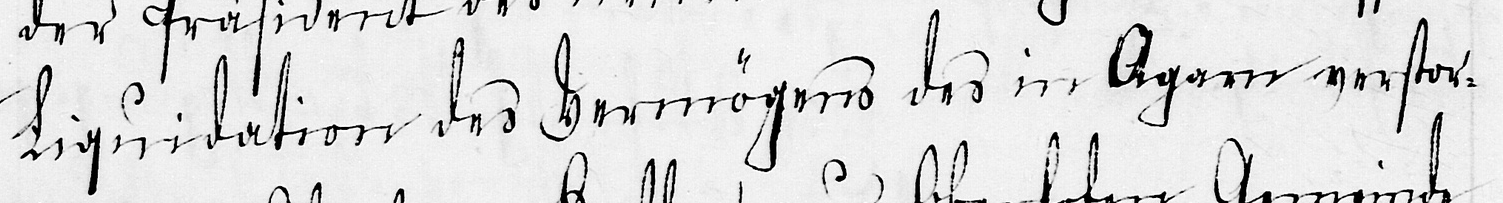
Liquidation des Vermögens des in Agarn verstor¬
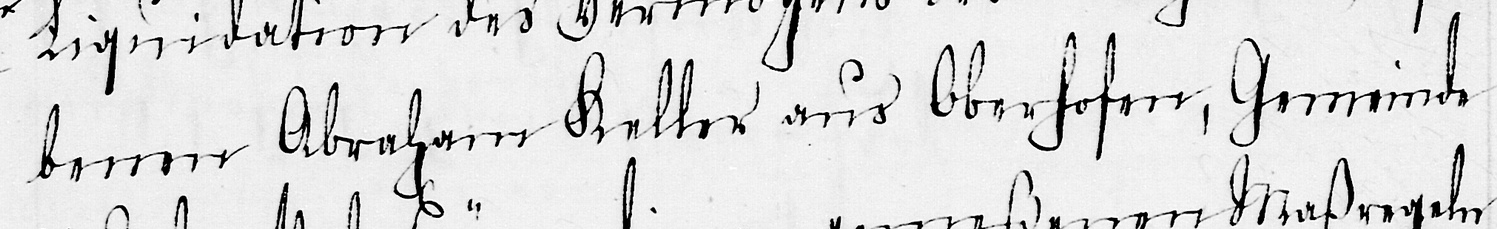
benen Abraham Keller aus Oberhofen, Gemeinde
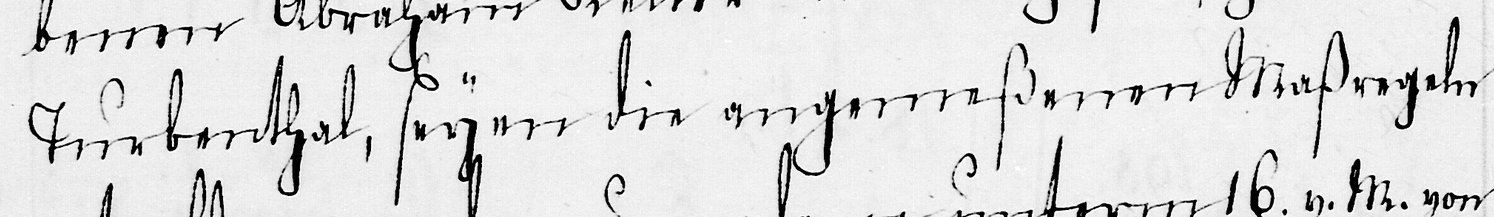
Turbenthal, seyen die angemeßenen Maßregeln
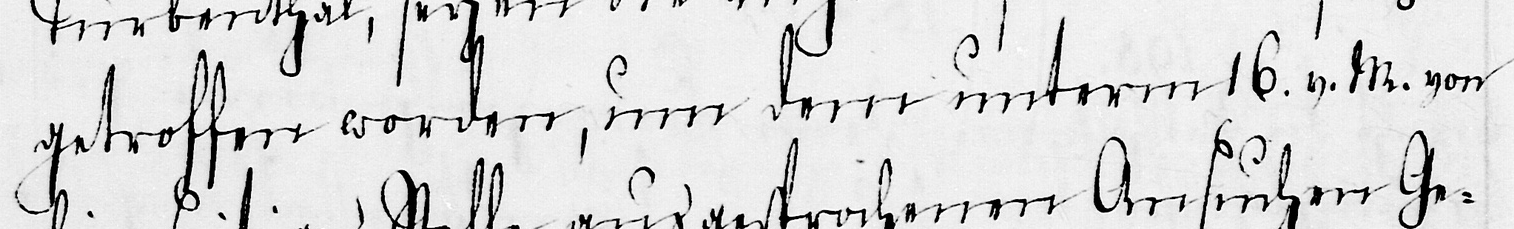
getroffen worden, um dem unterm 16. v. M. von
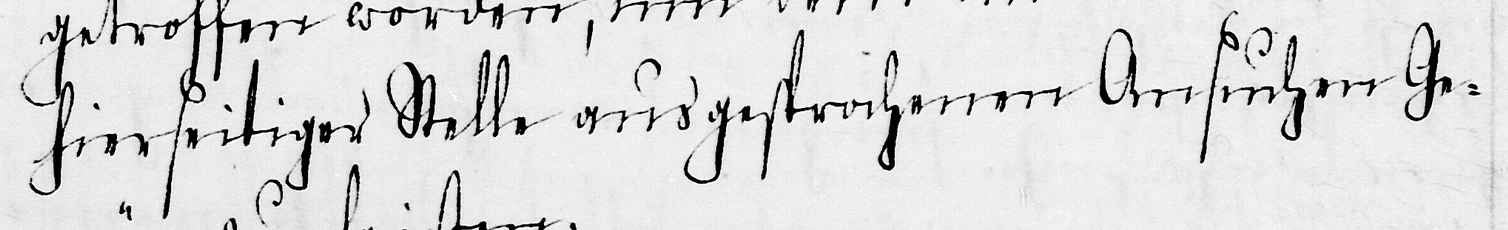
hierseitiger Stelle ausgesprochenen Ansuchen Ge¬
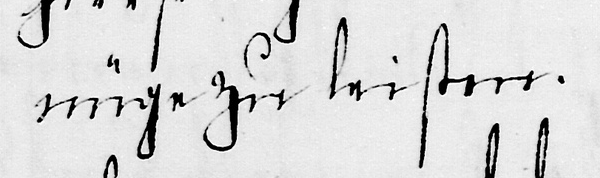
nüge zu leisten.
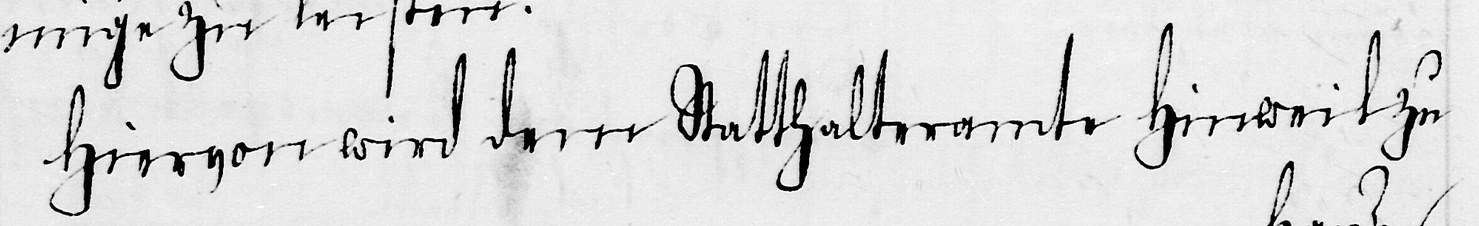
Hiervon wird dem Statthalteramte Hinweil zu
